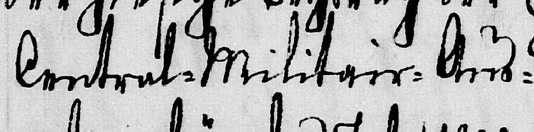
Central-Militair-Aus¬
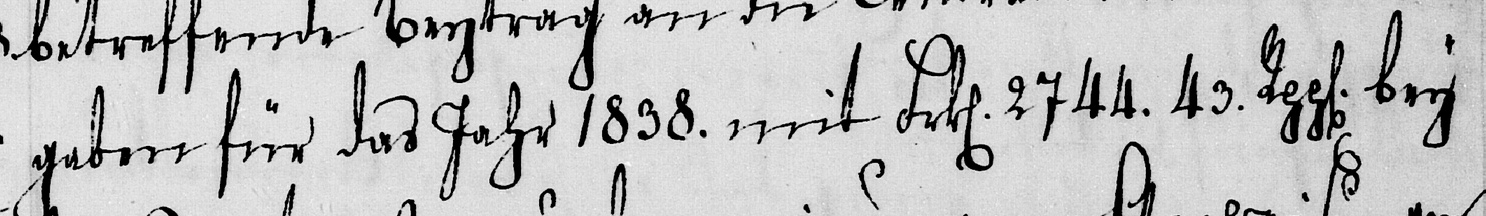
gaben für das Jahr 1838. mit Frk[en]. 2744. 43 Rpp[en].
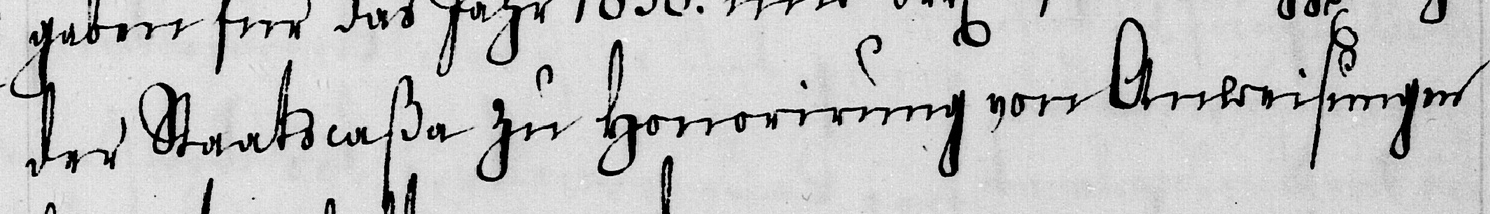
der Staatscaße zu Honorirung von Anweisungen
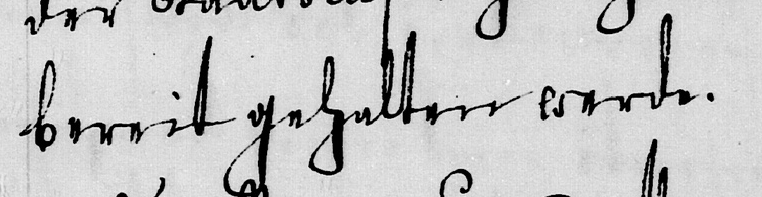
bereit gehalten werde.
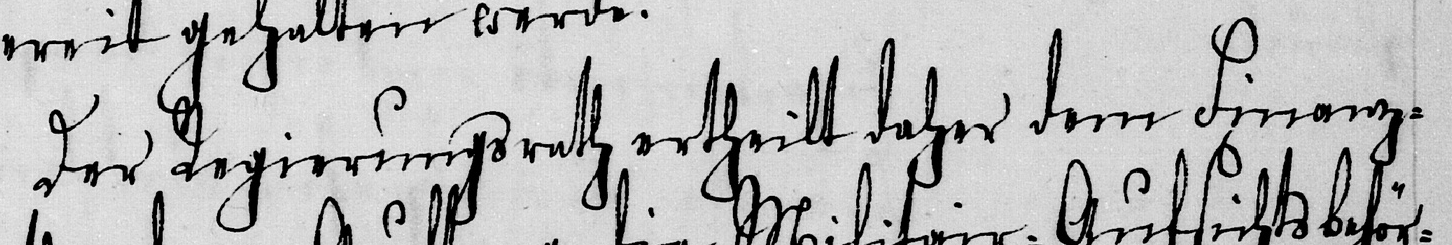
Der Regierungsrath ertheilt daher dem Finanz¬
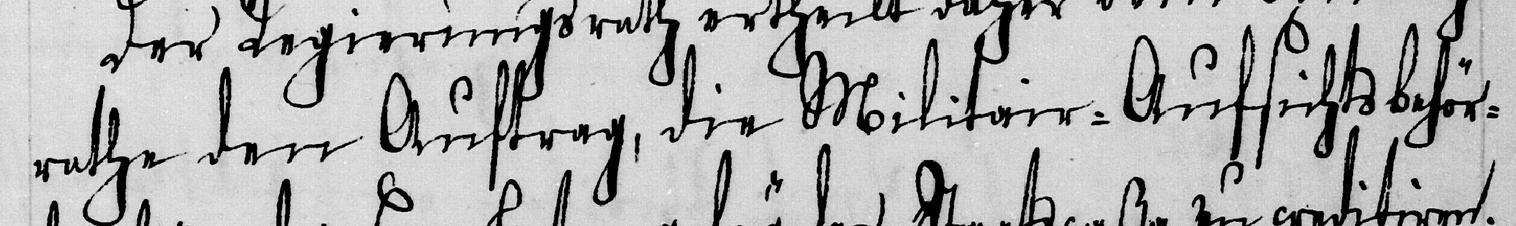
rathe den Auftrag, die Militair-Aufsichtsbehö¬
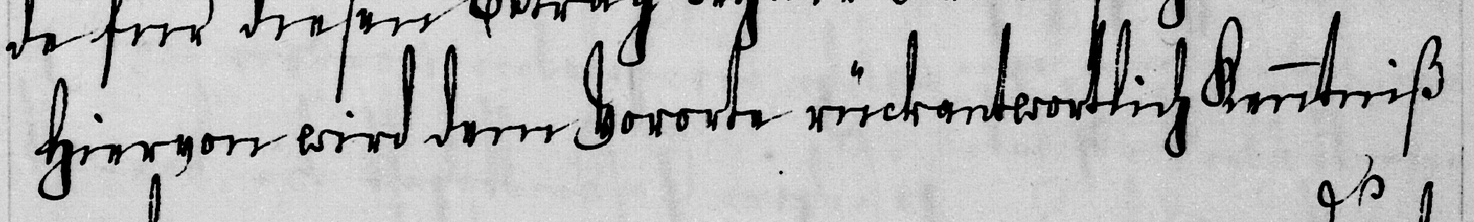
Hiervon wird dem Vororte rückantwortlich Kenntniß
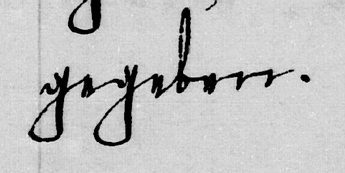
gegeben.
